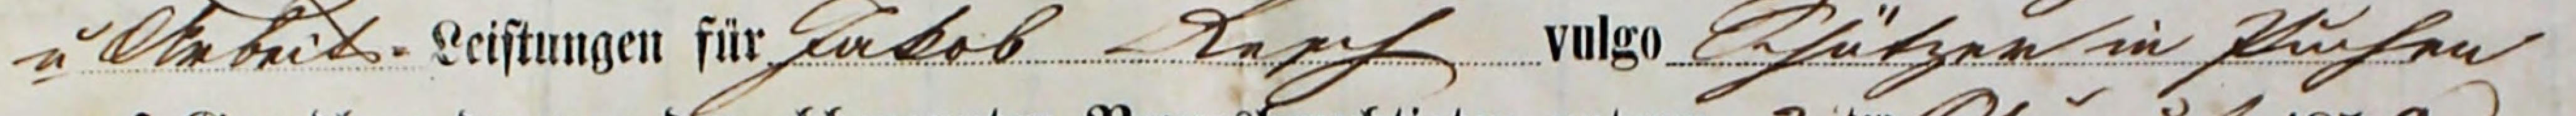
u Arbeit = Leistungen für Jakob Resch vulgo Schätzer in Puchen
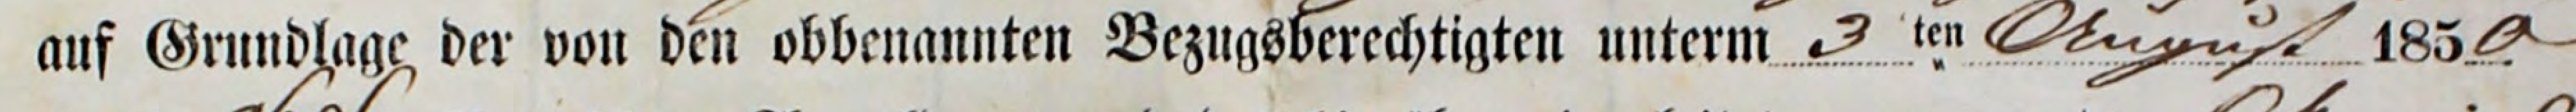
auf Grundlage der von den obbenannten Bezugsberechtigten unterm 3ten August 1850
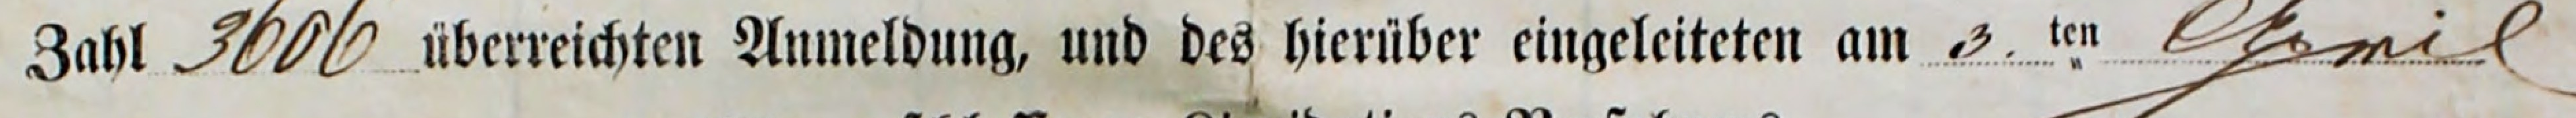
Zahl 3606 überrechten Anmeldung, und des hierüber eingeleiteten am 3ten April
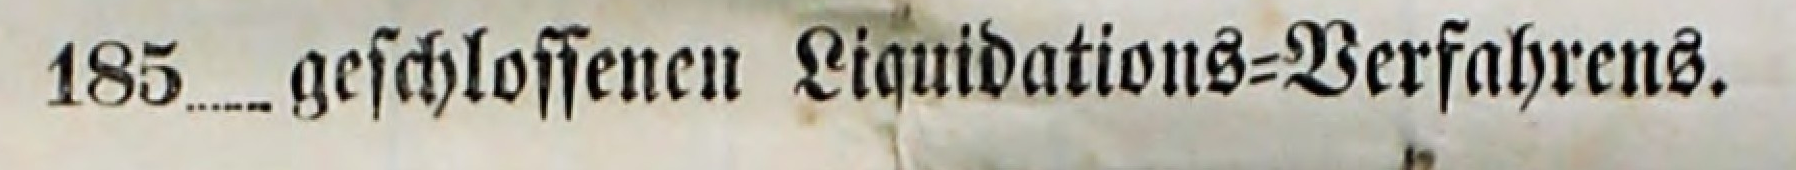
185.... geschlossenen Liquidations=Verfahrens.
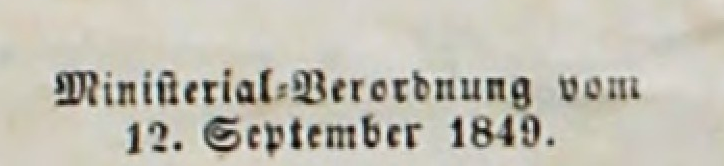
Ministerial=Verordnung vom
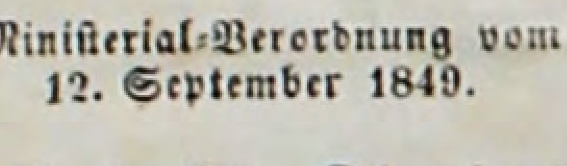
12. September 1849.
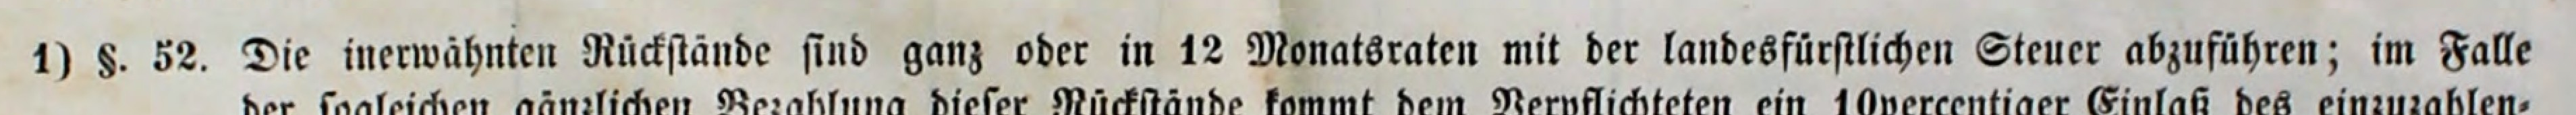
1) §. 52. Die inerwähnten Rückstände sind ganz oder in 12 Monatsraten mit der landesfürstlichen Steuer abzuführen; im Falle
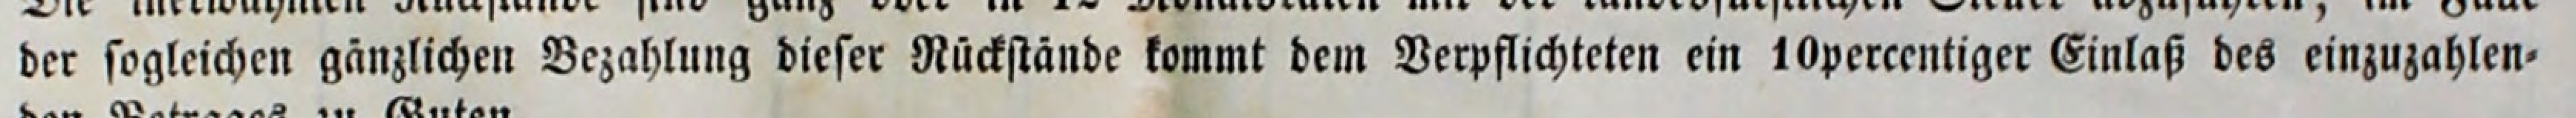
der sogleichen gänzlichen Bezahlung dieser Rückstände kommt dem Verpflichteten ein 10perzentiger Einlaß des einzuzahlen=
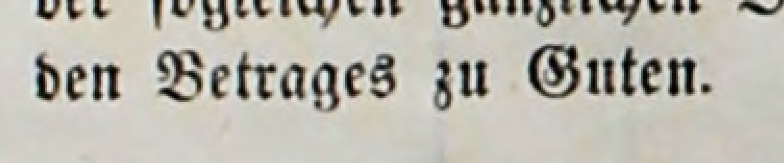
den Betrages zu Guten.
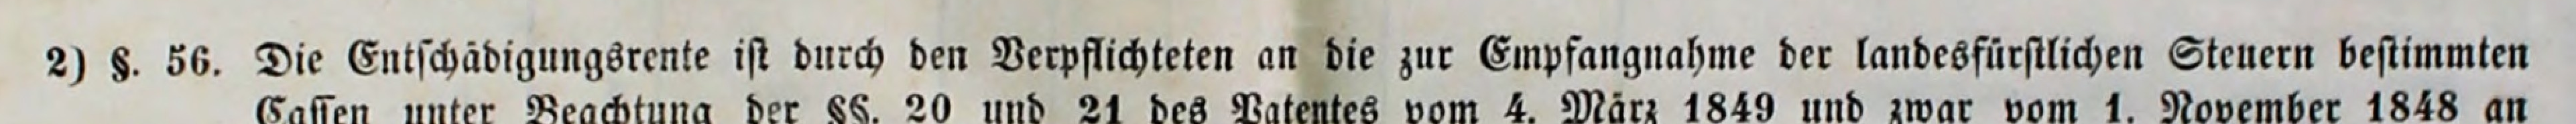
2) §. 56. Die Entschädigungsrente ist durch den Verpflichteten an die zur Empfangnahme der landesfürstlichen Steuern bestimmten
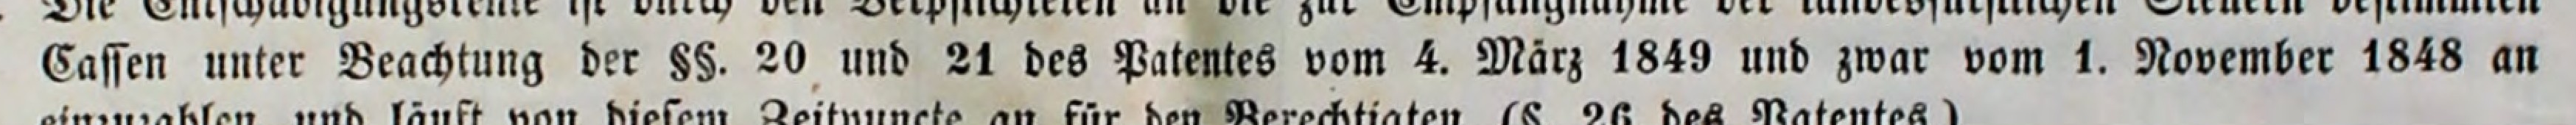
Cassen unter Beachtung der §§. 20 und 21 des Patentes vom 4. März 1849 und zwar vom 1. November 1848 an
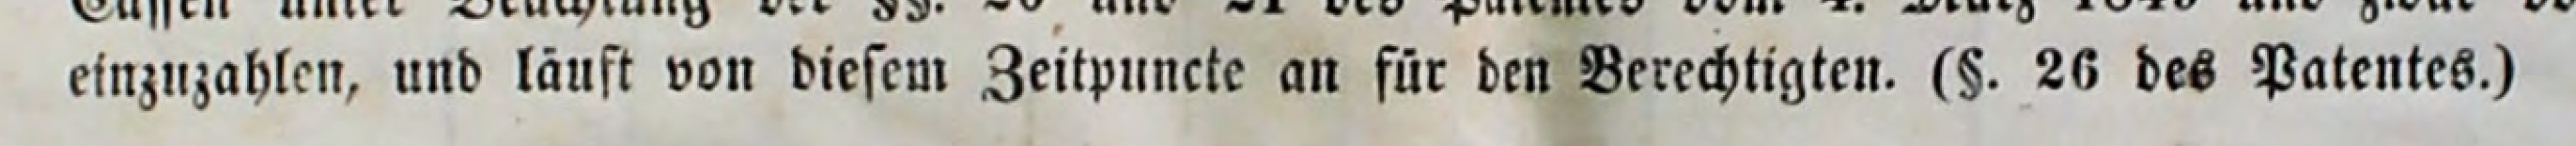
einzuzahlen, und läuft von diesem Zeitpunkte an für den Berechtigten. (§. 26 des Patentes.)
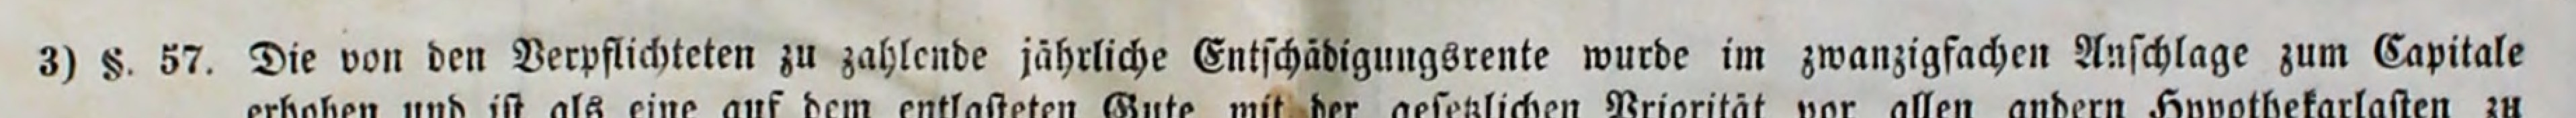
3) §. 57. Die von den Verpflichteten zu zahlende jährliche Entschädigungsrente wurde im zwanzigfachen Anschlage zum Capitale
